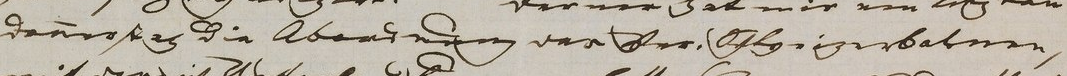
Donnerstag die Abordnung der Ver. Schweizerbahnen,
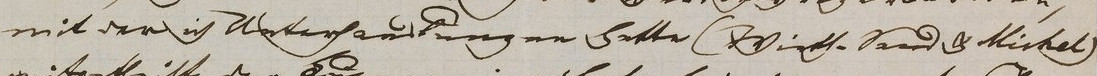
mit der ich Unterhandlungen hatte ( Wirth-Sand & Michel )
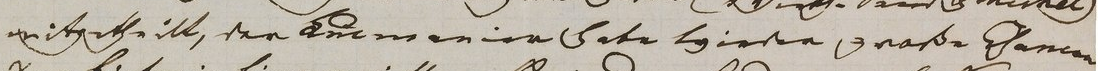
mitgetheilt, der Lucmanier habe wieder große Chancen
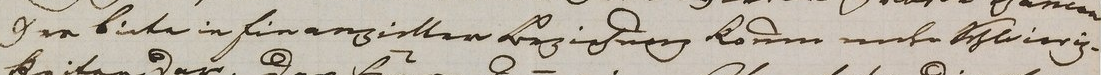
& er biete in finanzieller Beziehung kaum mehr Schwierig-
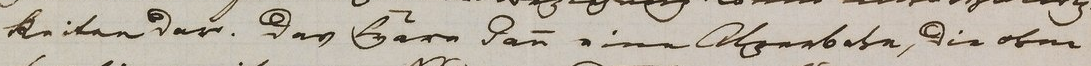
keiten dar. Das wäre dann eine Alpenbahn, die ohne
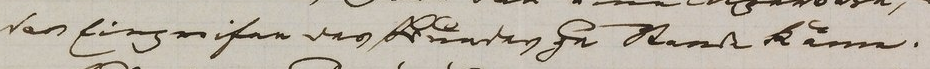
das Eingreifen des Bundes zu Stande käme.
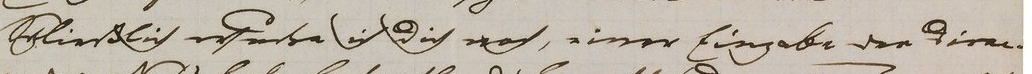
Schließlich ersuche ich Dich noch, einer Eingabe der Direc-
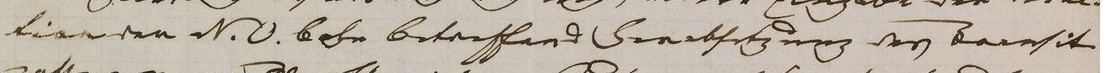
tion der N.O.Bahn betreffend Herabsetzung des Transit-
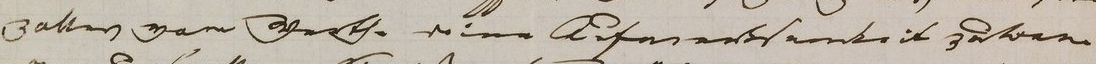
zolles vom Werthe Deine Aufmerksamkeit zuwen-
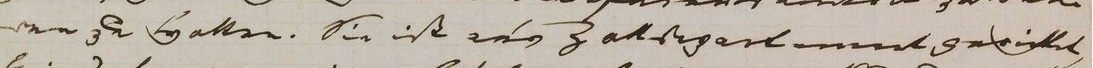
den zu wollen. Sie ist an's Zolldepartement gerichtet,
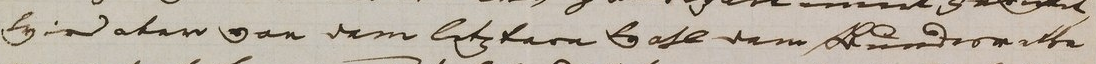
wird aber von dem letztern wohl dem Bundesrathe
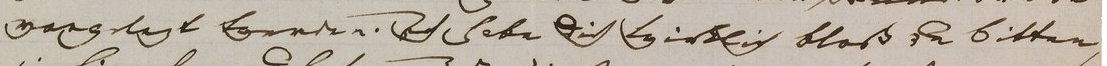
vorgelegt werden. Ich habe Dich wirklich bloß zu bitten,
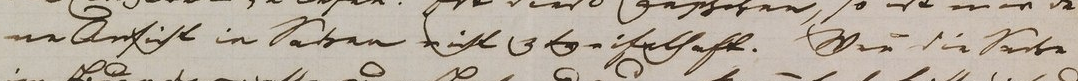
ne Ansicht in Sachen nicht zweifelhaft. Wenn die Sache
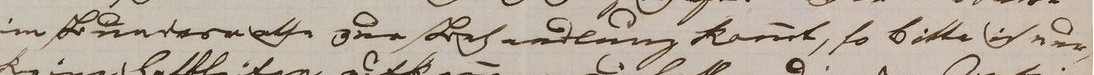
im Bundesrathe zur Behandlung kommt, so bitte ich nur,
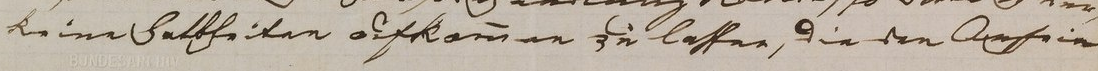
keine Halbheiten aufkommen zu lassen, die den Anschein
